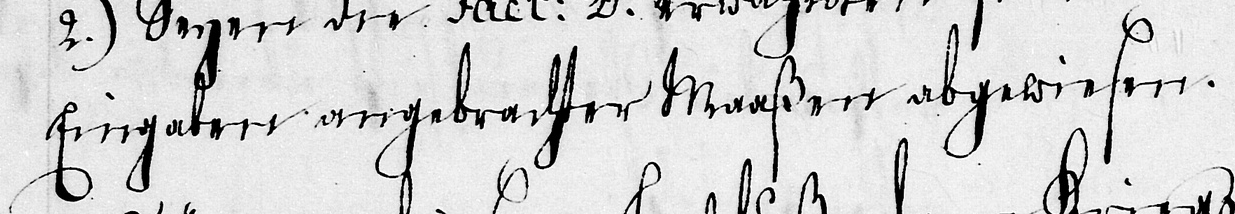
Eingaben angebrachter Maaßen abgewiesen.
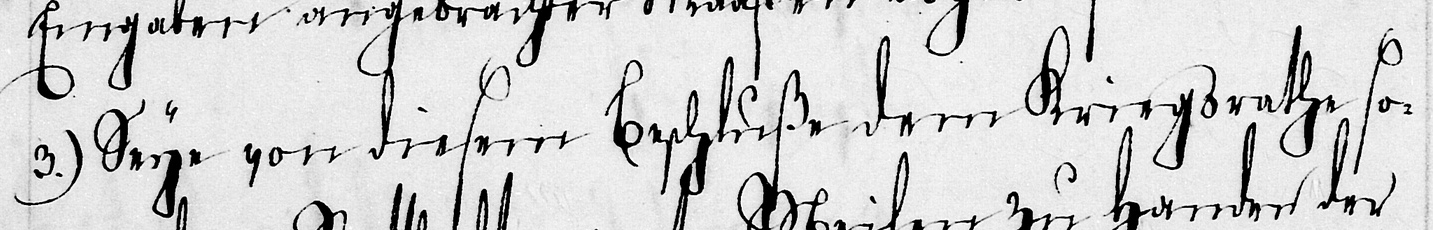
3.) Seye von diesem Beschluße dem Kriegsrathe so¬
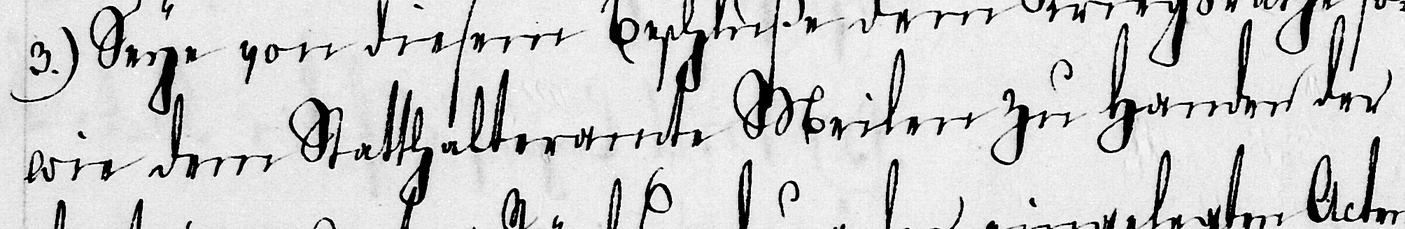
wie dem Statthalteramte Meilen zu Handen der
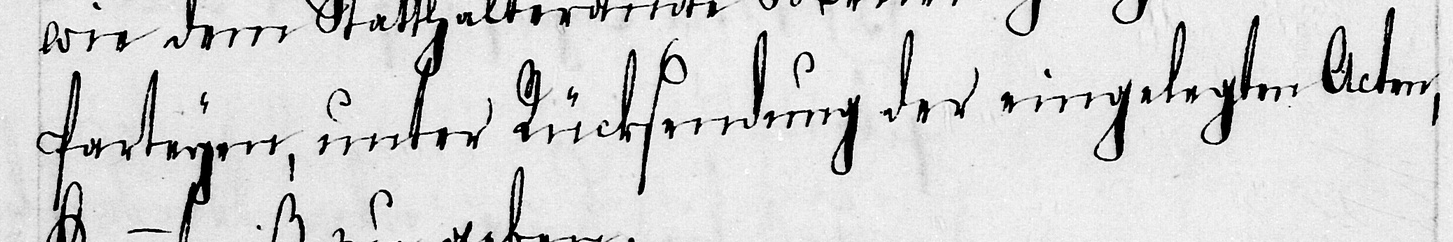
Parteyen, unter Rücksendung der eingelegten Acten,
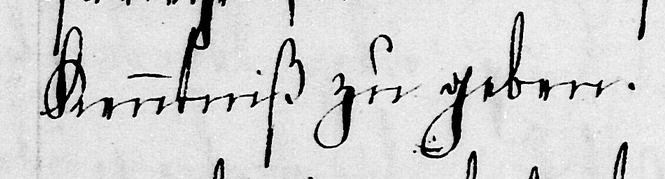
Kenntniß zu geben.
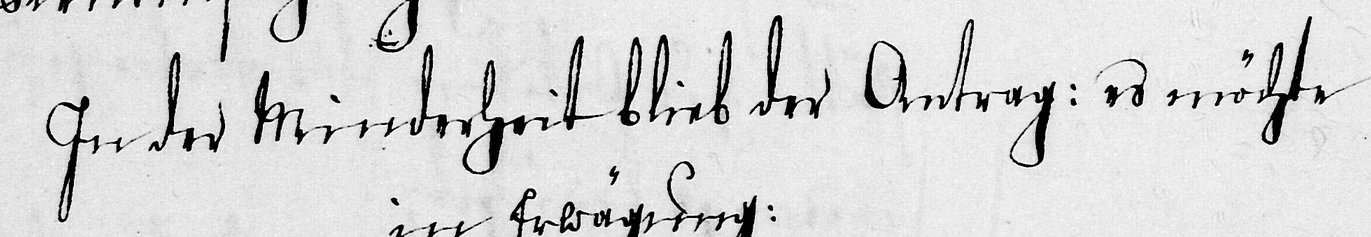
In der Minderheit blieb der Antrag: es möchte
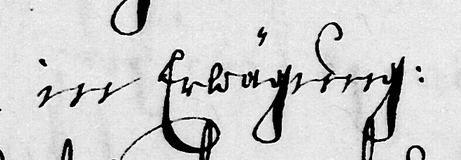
in Erwägung:
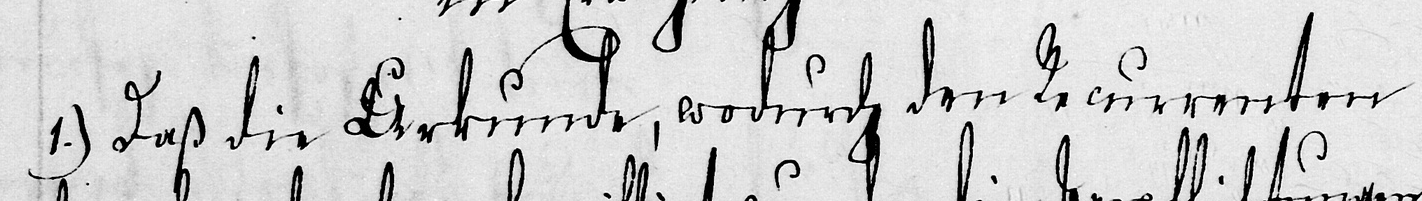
1.) Daß die Urkunde, wodurch den Recurrenten
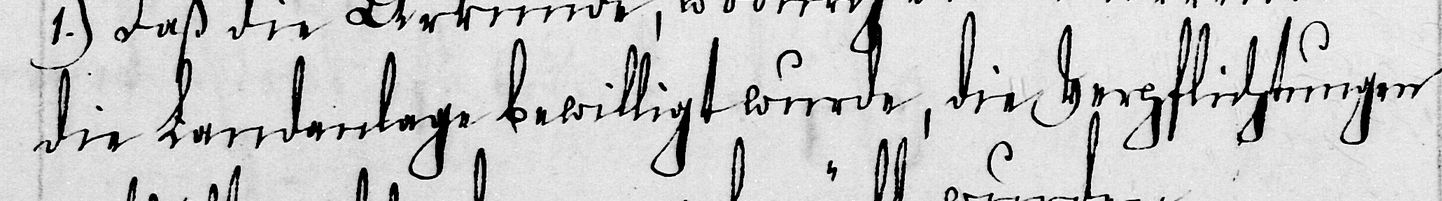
die Landanlage bewilligt wurde, die Verpflichtungen
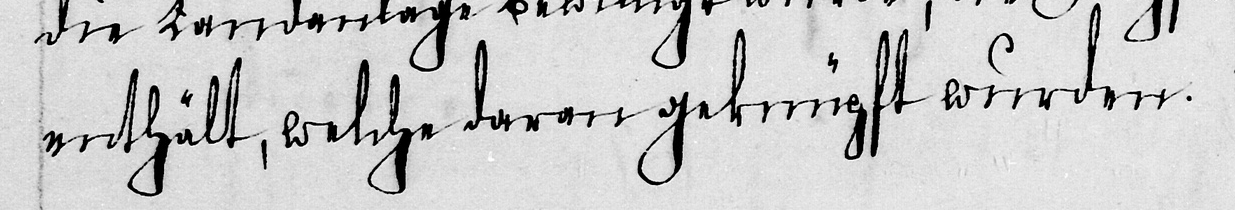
enthält, welche daran geknüpft wurden.
